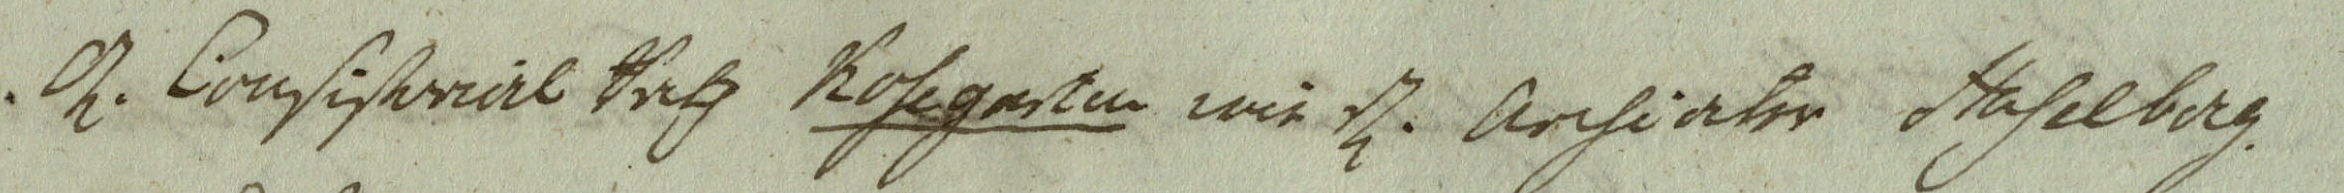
dh. Consistorial Rath Kosegarten wie dh. Archiater Haselberg.
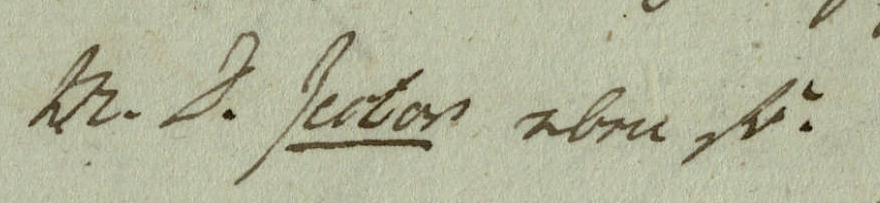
M. D. Rector eben so.
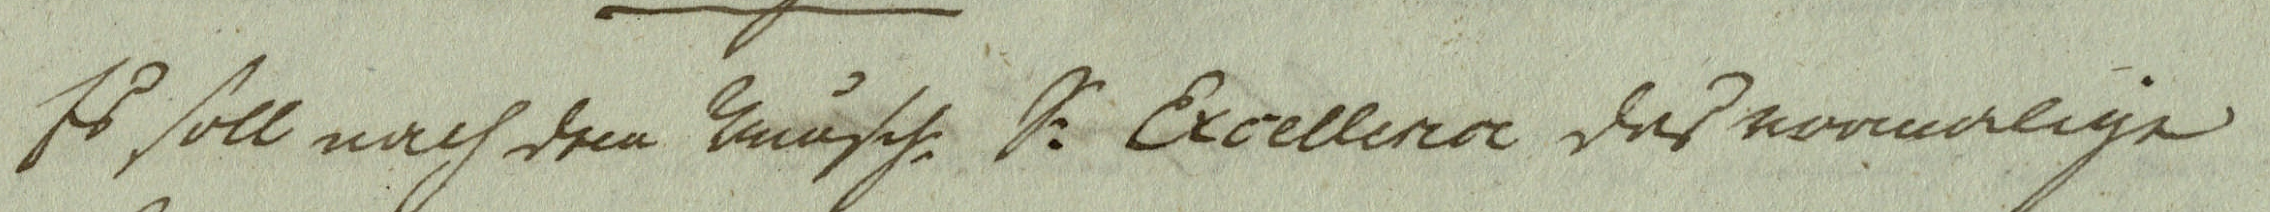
Es soll nach dem Wunsche Sr. Excellence das vormalige
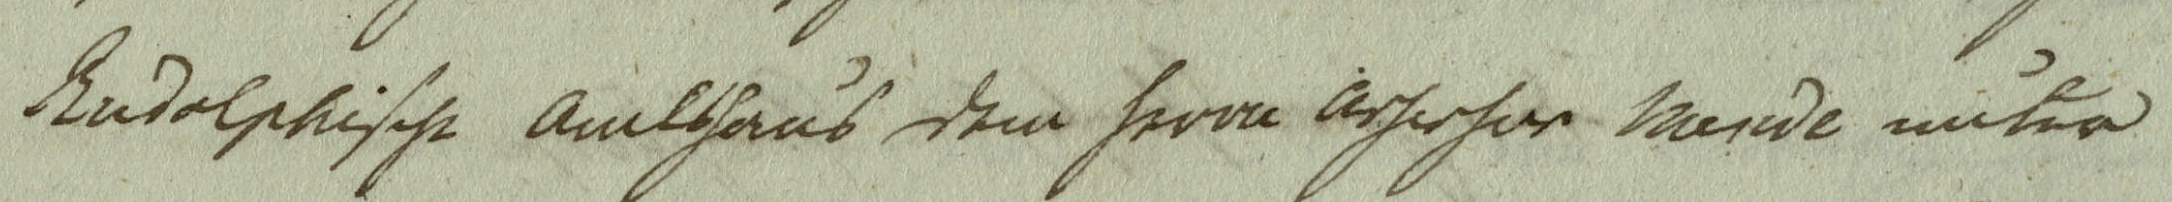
Rudolpische Amtshaus dem herrn Archiater Mende unter
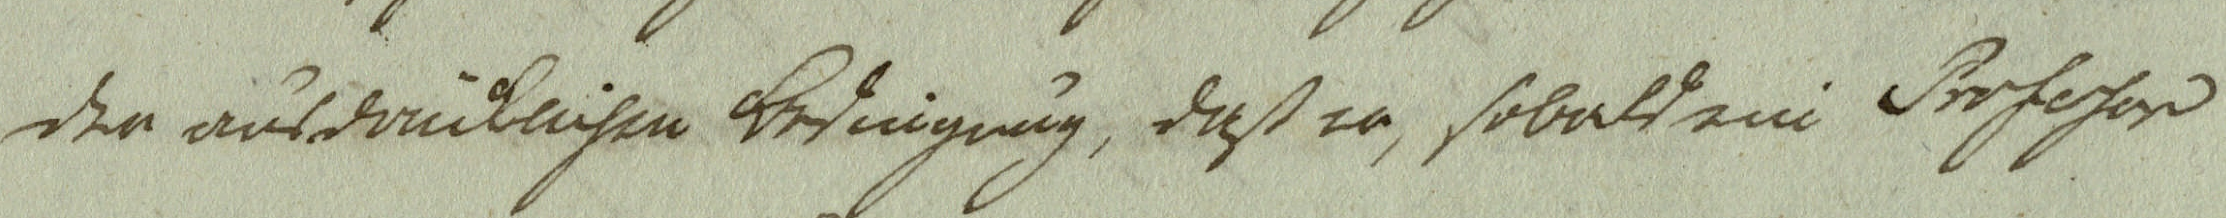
der ausdrücklichen Bedingung, daß er, sobald ein Professor
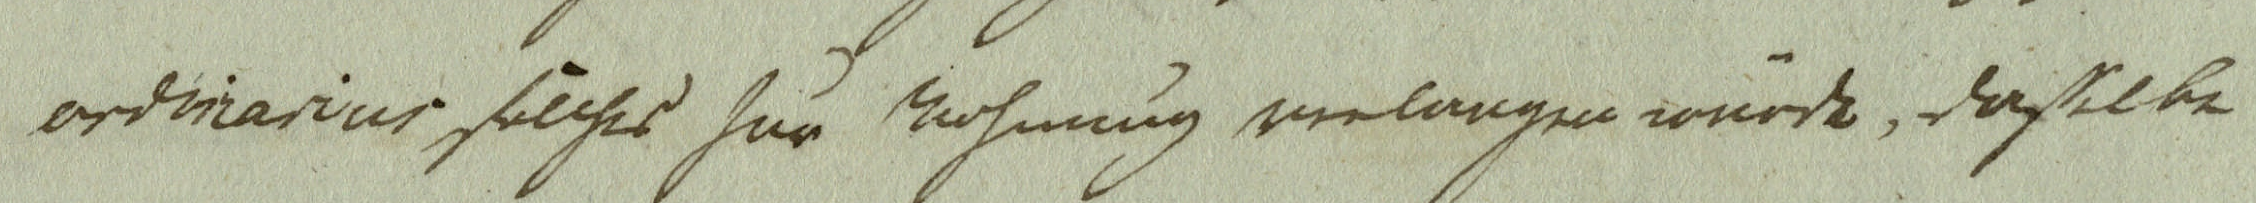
ordinarius solches zur Wohnung verlangen würde, dasselbe
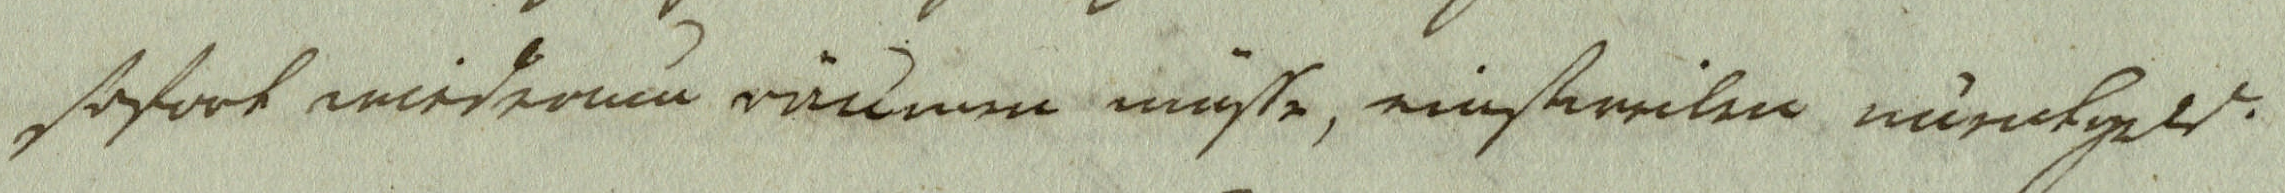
sofort wiederum räumen müsse, einstweilen unentgeld¬
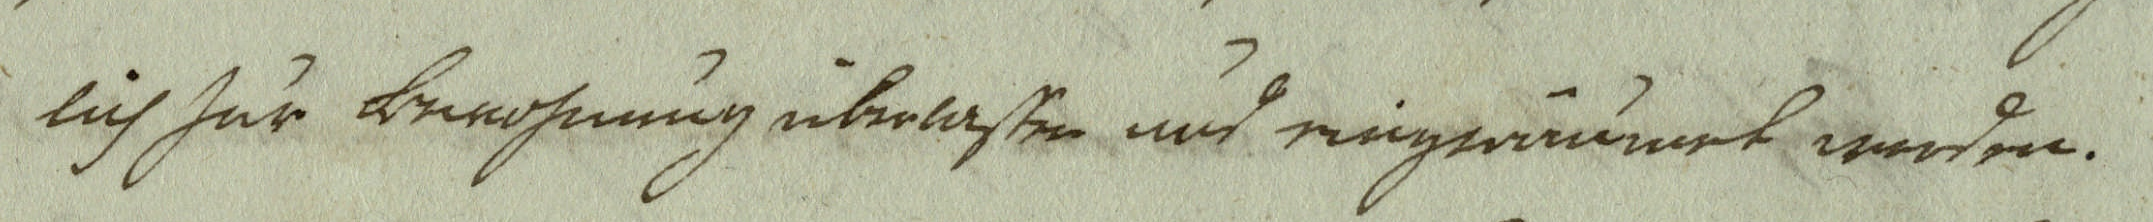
lich zur Bewohnung überlassen und eingeräumet werden.
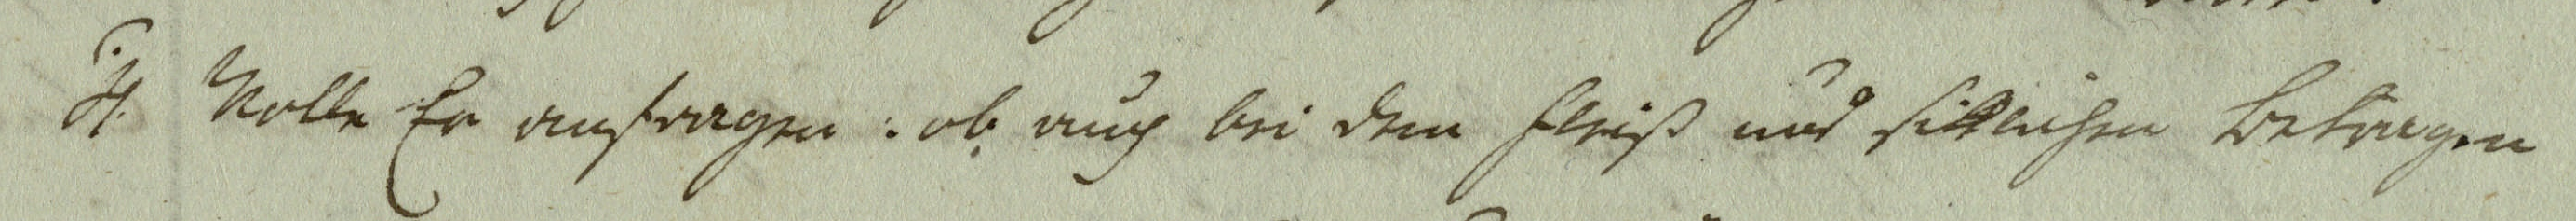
4. Wolle Er anfragen, ob auch bei dem Fleiß und sittlichen Betragen
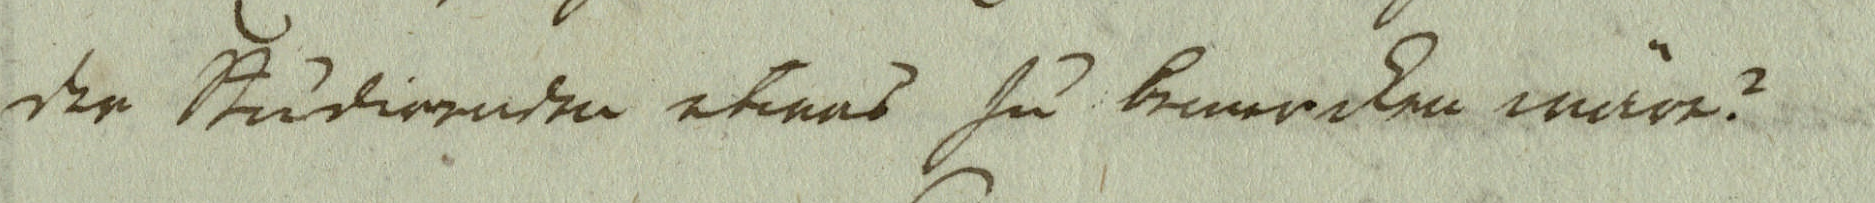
der Studirenden etwas zu bemercken wäre?
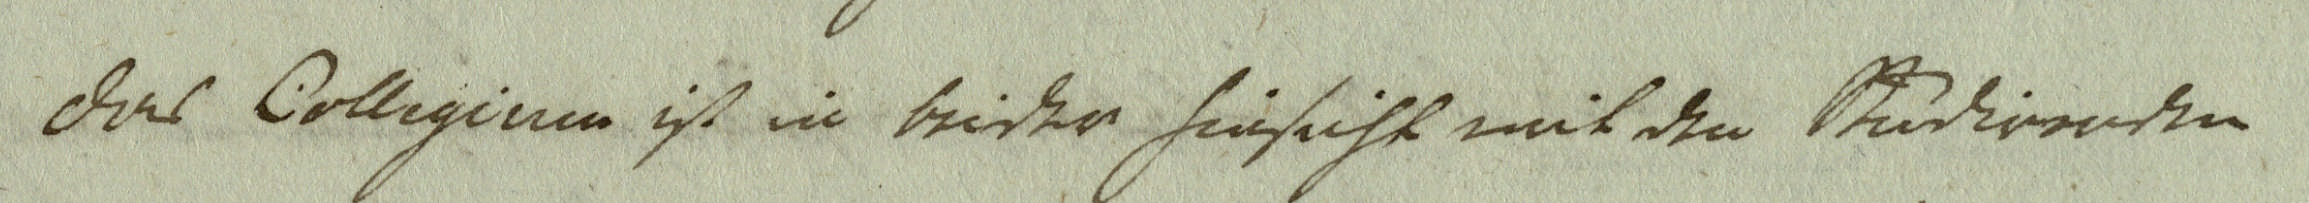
Das Collegium ist in beider hinsicht mit den Studirenden
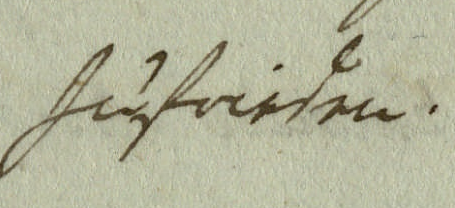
zufrieden.
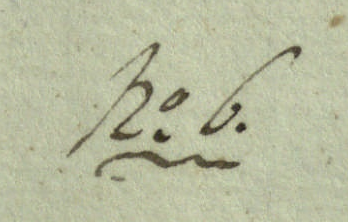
Nº 6.
